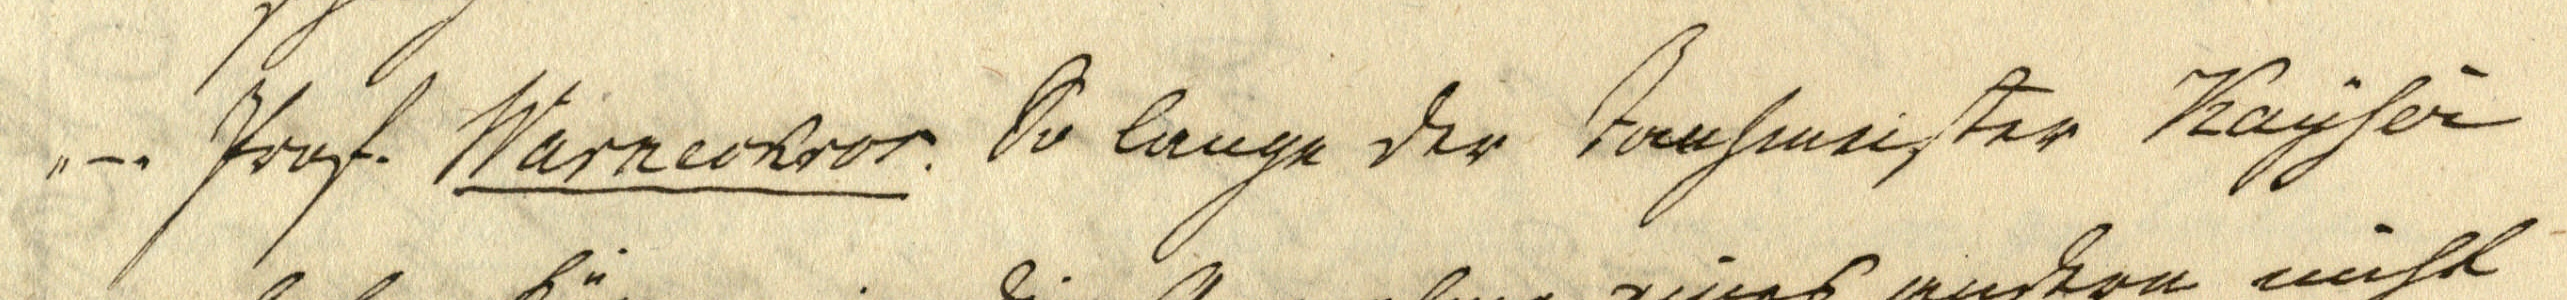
" - " Prof. Warneckros. So lange der Tanzmeister Kayser
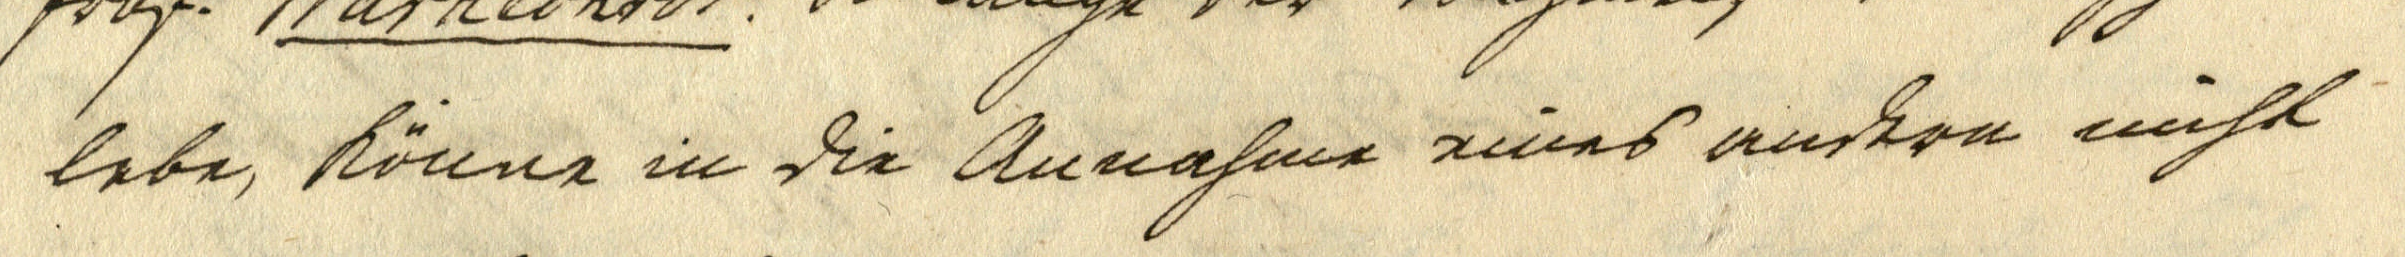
lebe, könne in die Annahme eines andern nicht
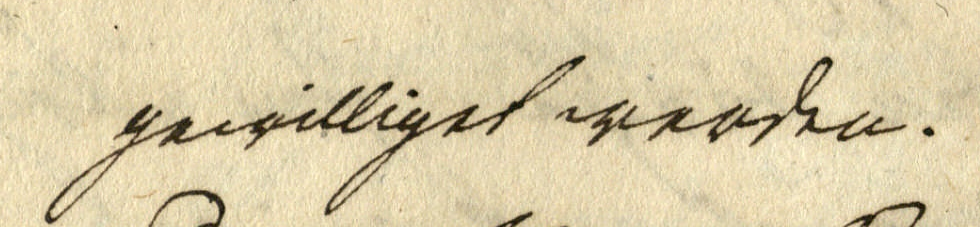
gewilliget werden.
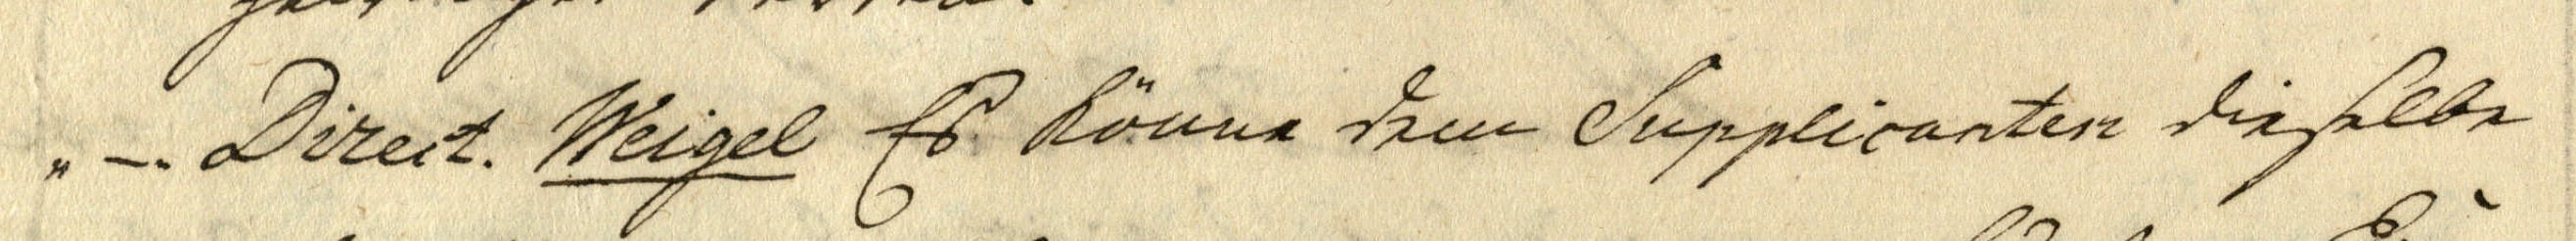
" - " Direct. Weigel Es könne dem Supplicanten dieselbe
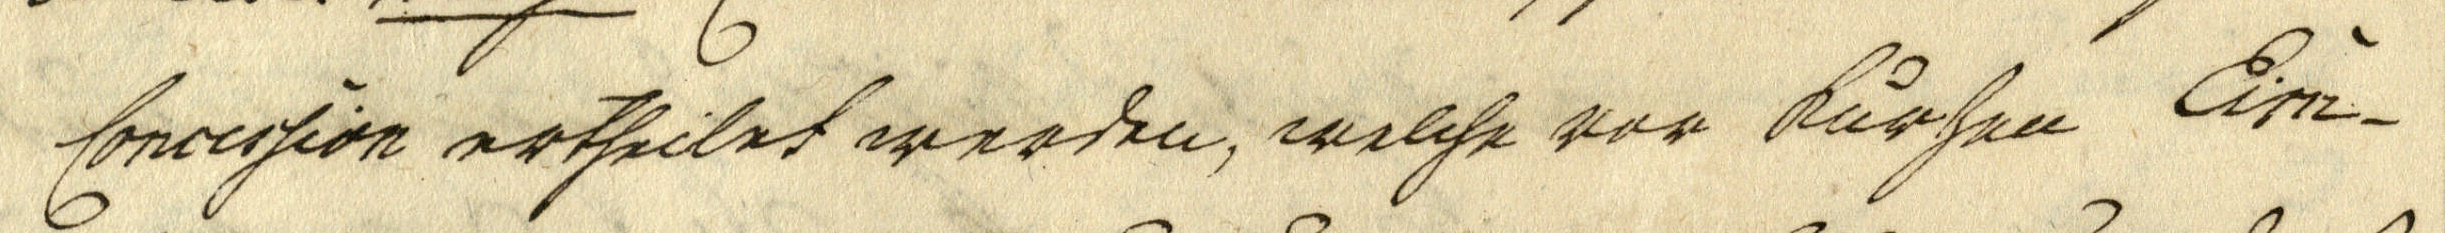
Concession ertheilet werden, welche vor kurzen Eim-
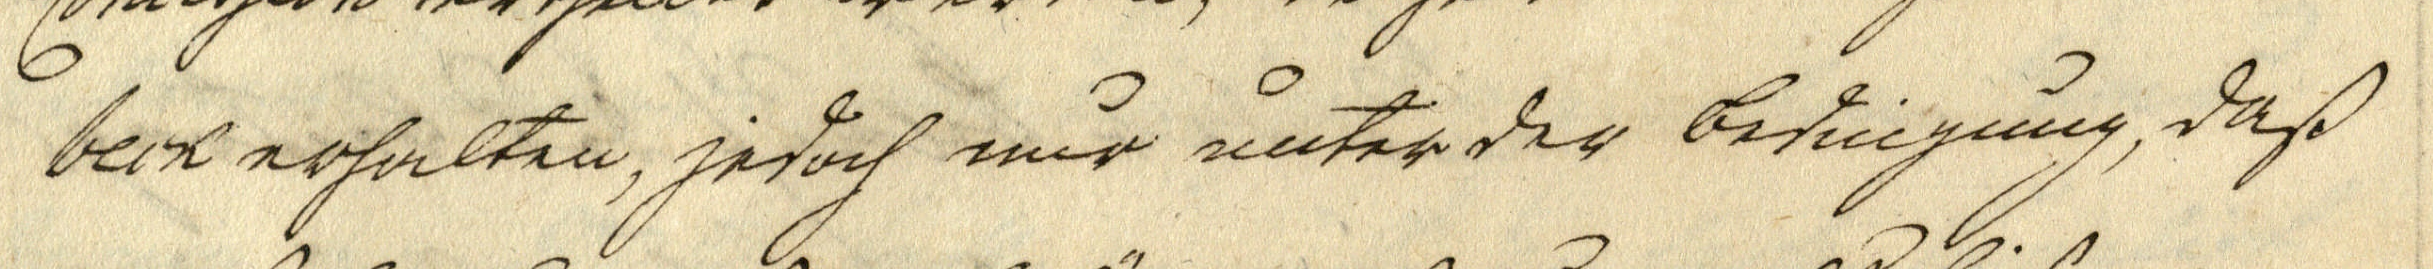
beck erhalten, jedoch nur unter der Bedingung, daß
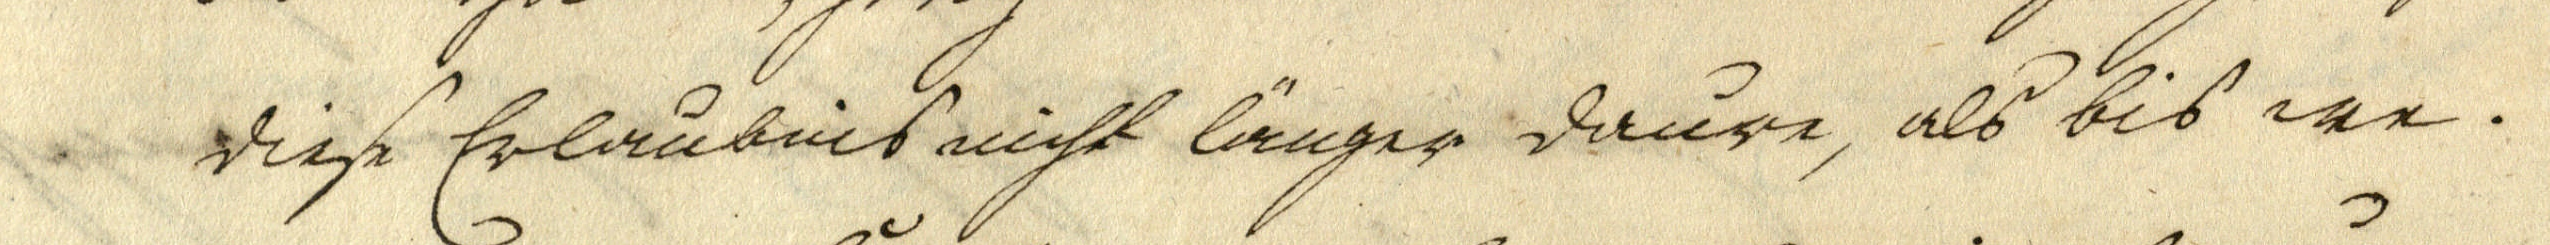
diese Erlaubnis nicht länger daure, als bis we-
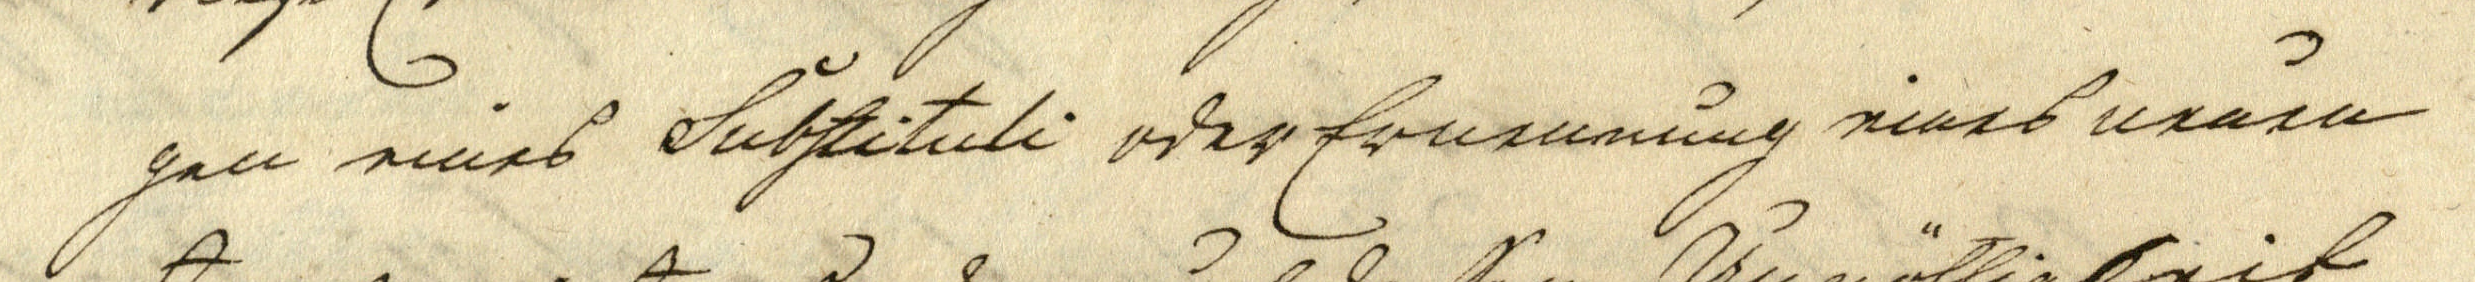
gen eines Substituti oder Ernennung eines neuen
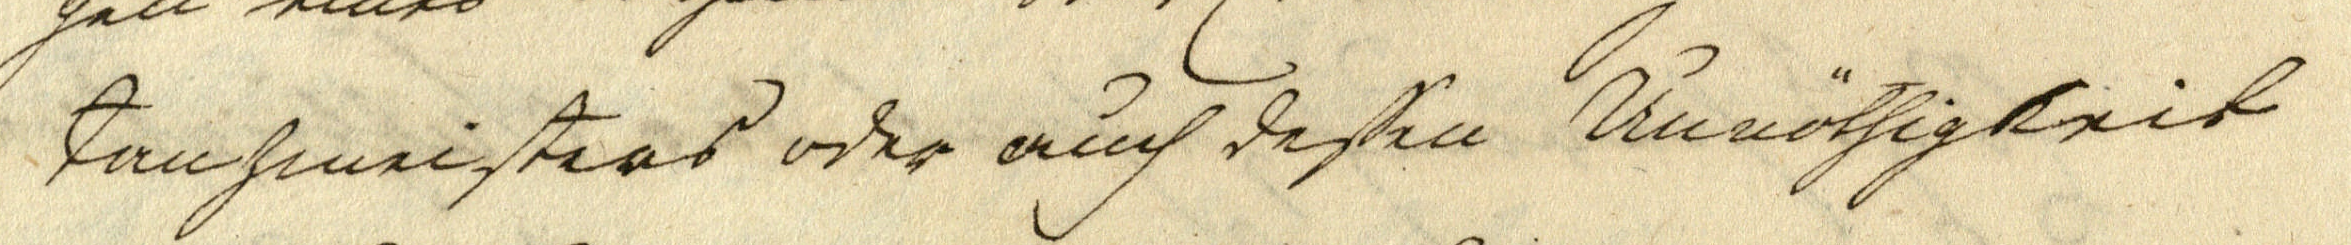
Tanzmeisters oder auch dessen Unnöthigkeit
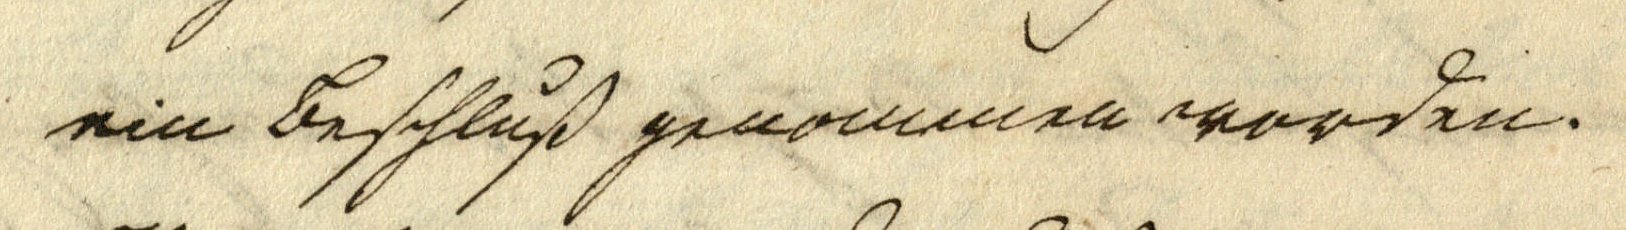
ein Beschluß genommen worden.
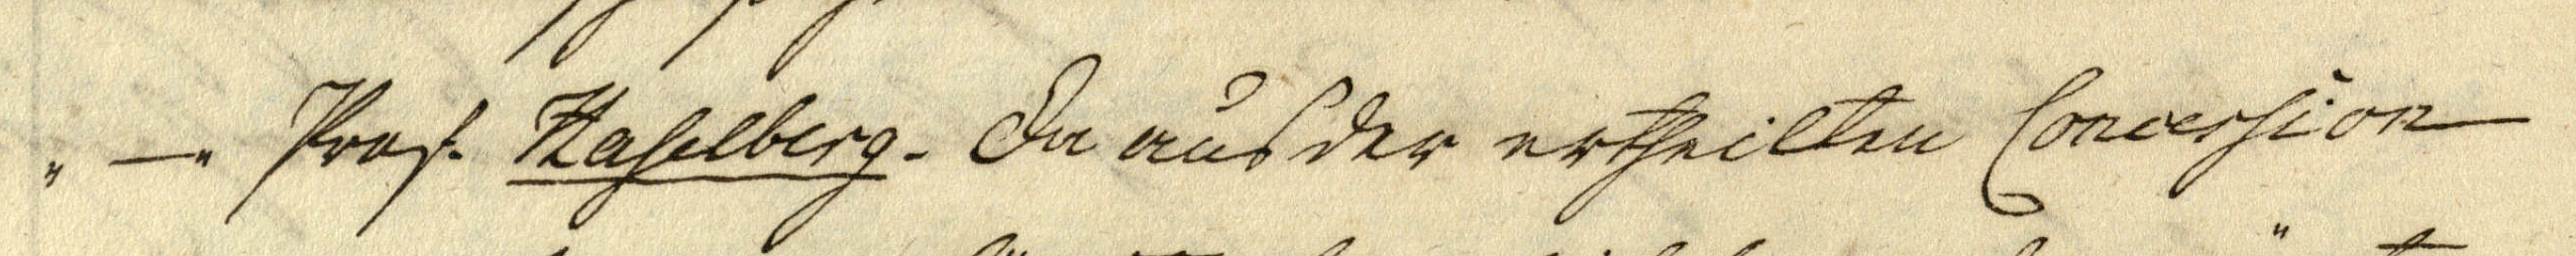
" - " Prof. Haselberg. Da aus der ertheilten Concession
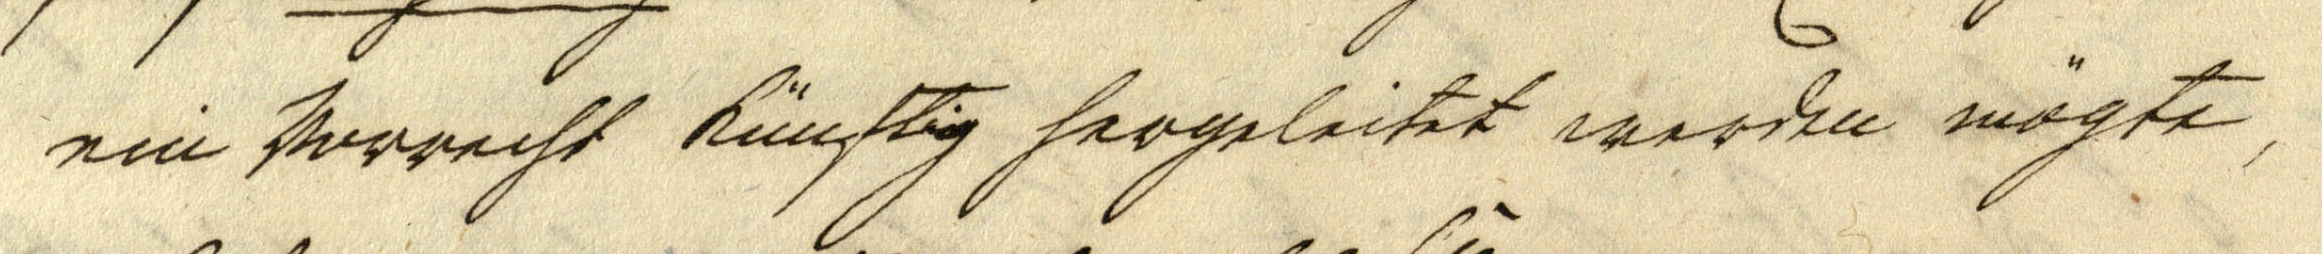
ein Vorrecht künftig hergeleitet werden mögte,
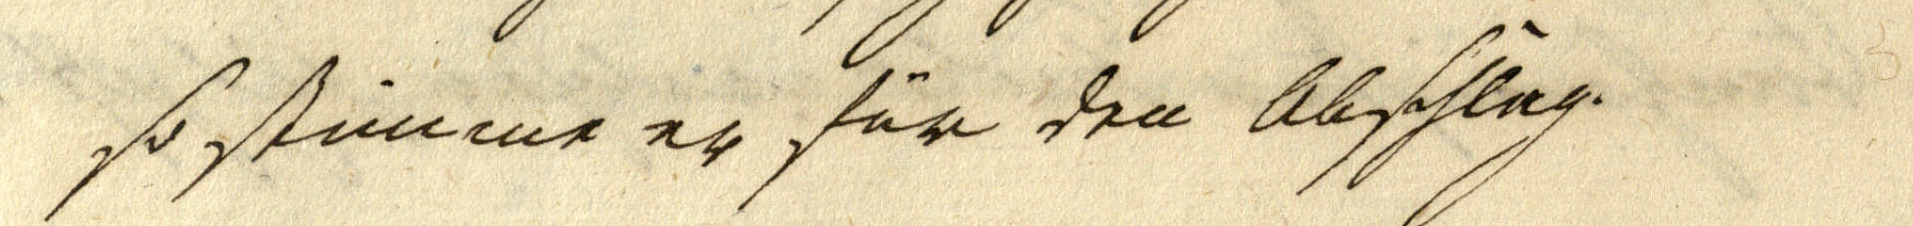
so stimme er für den Abschlag.
